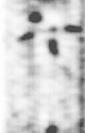大
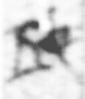攻（工）
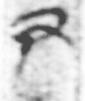尹
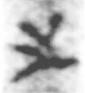之
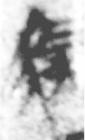駟
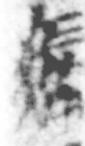○（服）
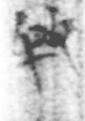牧
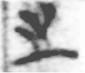之
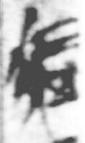騏
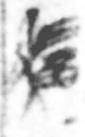驂
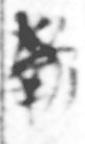新（新）
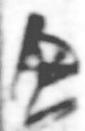官
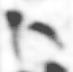人
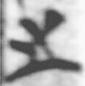之
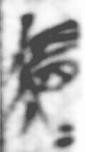駟
